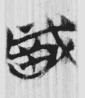戠
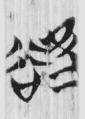欲
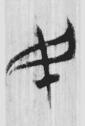民
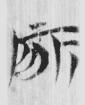所
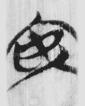安
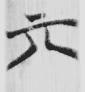亓
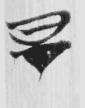旦
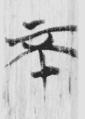不
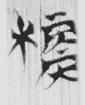{木丙丙}
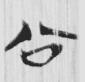公
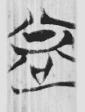益
